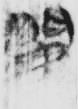○（關）
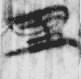里
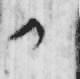人
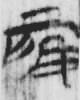雇
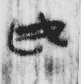女
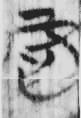○（返）
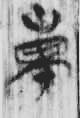東
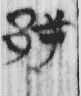邗
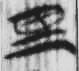里
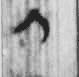人
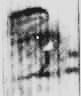場
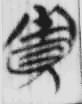賈
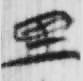里
